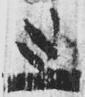之
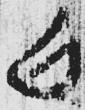㠯（以）
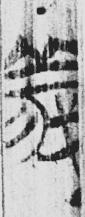義
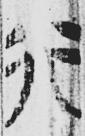行
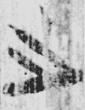之
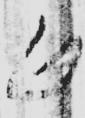㠯（以）
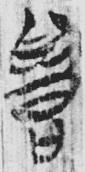豊（禮）
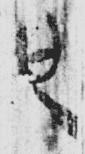也
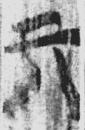亓（其）
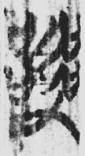○（亂）
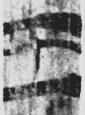王
